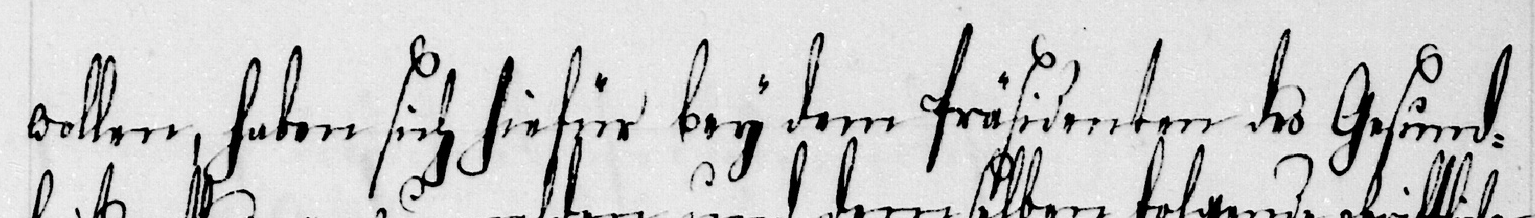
len, haben sich hiefür bey dem Präsidenten des Gesun¬
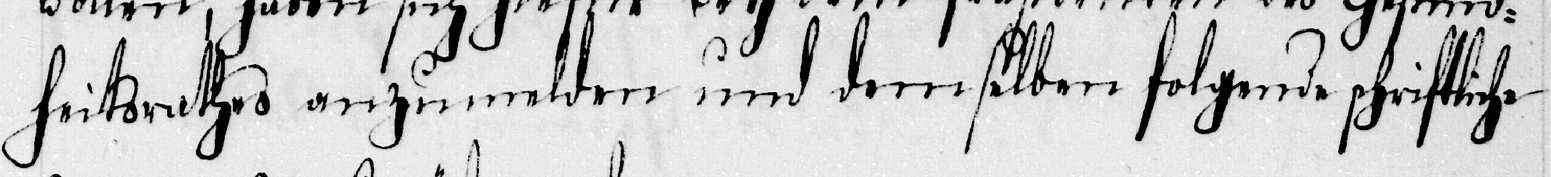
dheitsrathes anzumelden und demselben folgende schriftl¬
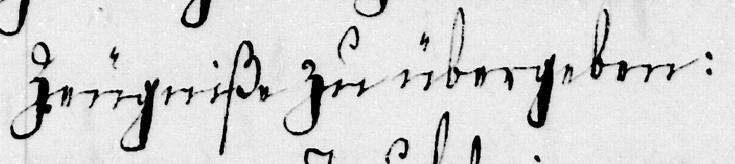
Zeugniße zu übergeben:
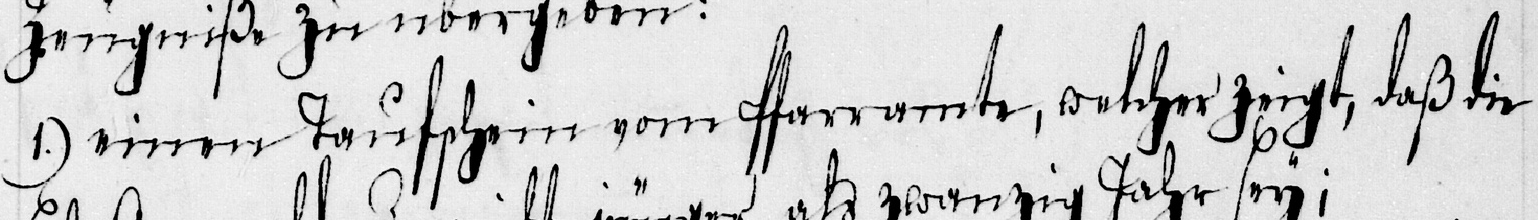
1.) einen Taufschein vom Pfarramte, welcher zeigt, daß die
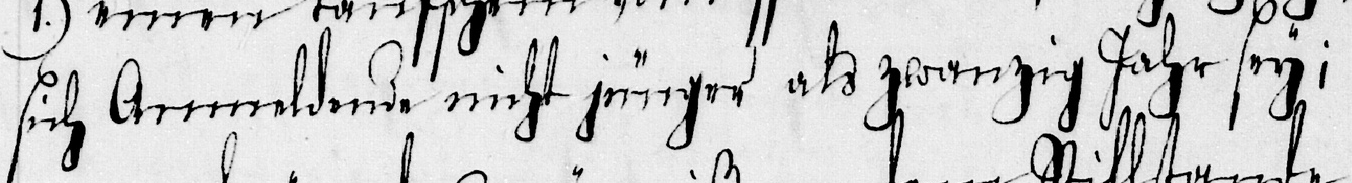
sich Anmeldende nicht jünger als zwanzig Jahr sey;
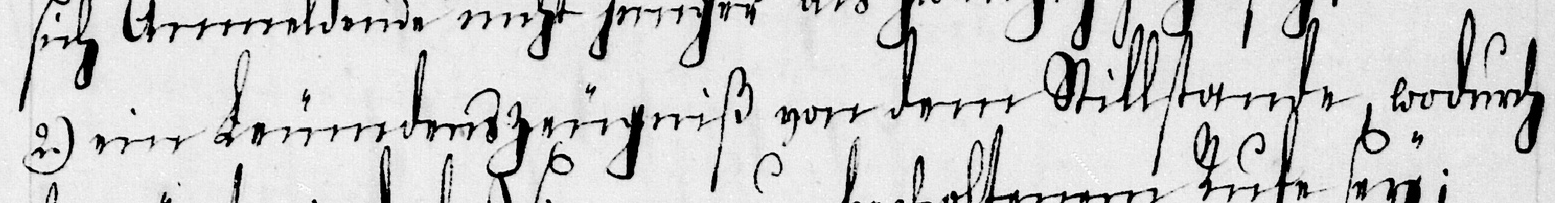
2.) ein Leumdenszeugniß von dem Stillstande wodurch
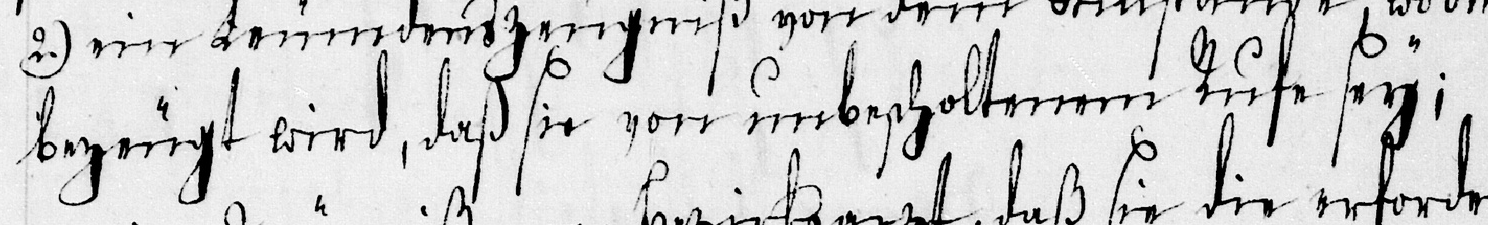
bezeugt wird, daß sie von unbescholtenem Rufe sey;
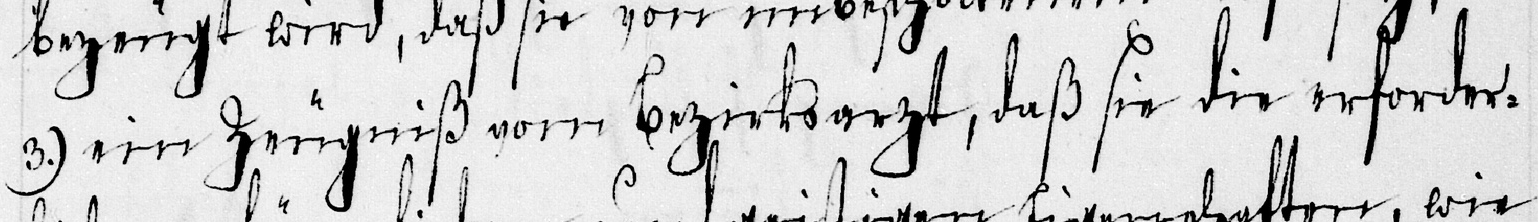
3.) ein Zeugniß vom Bezirksarzt, daß sie die erforder¬
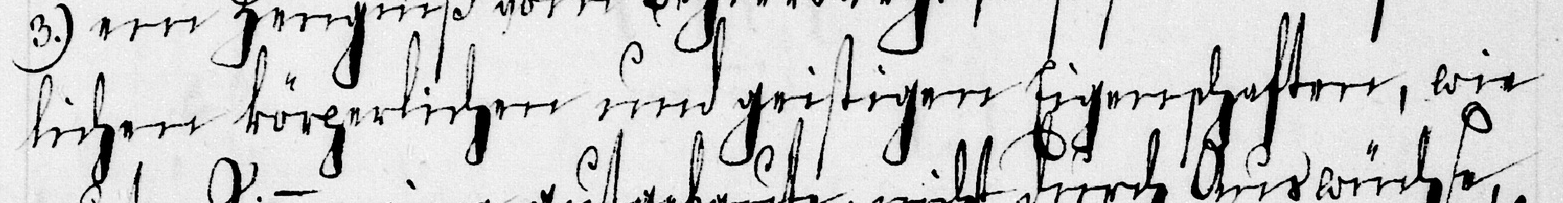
lichen körperlichen und geistigen Eigenschaften, wie
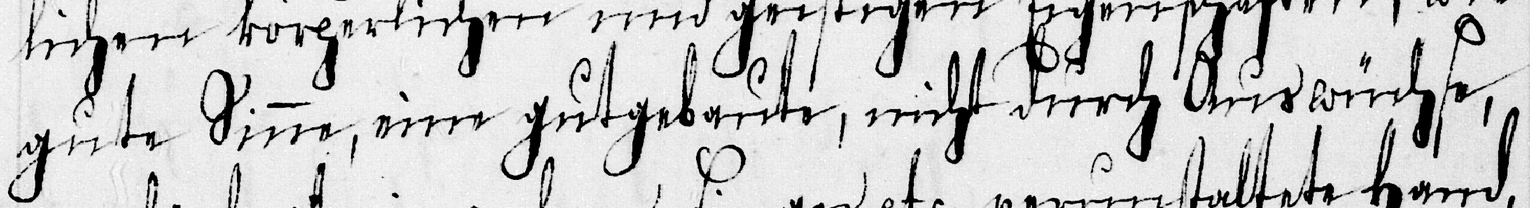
gute Sinne, eine gutgebaute, nicht durch Auswüchse,
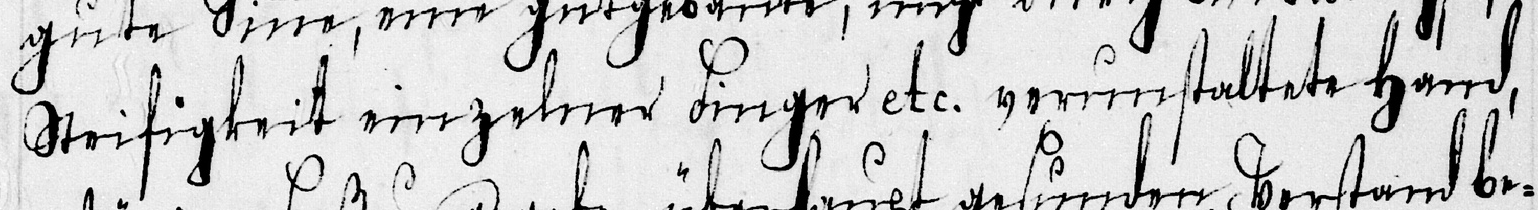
Steifigkeit einzelner Finger etc. verunstaltete Hand,
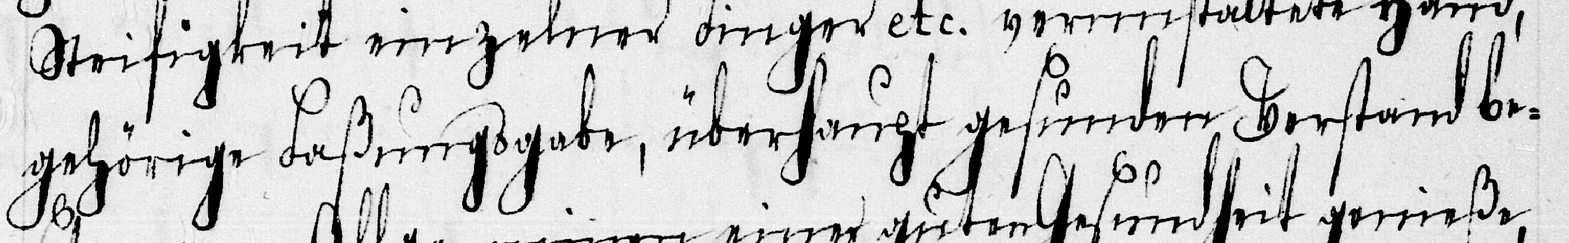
gehörige Faßungsgabe, überhaupt gesunden Verstand be¬
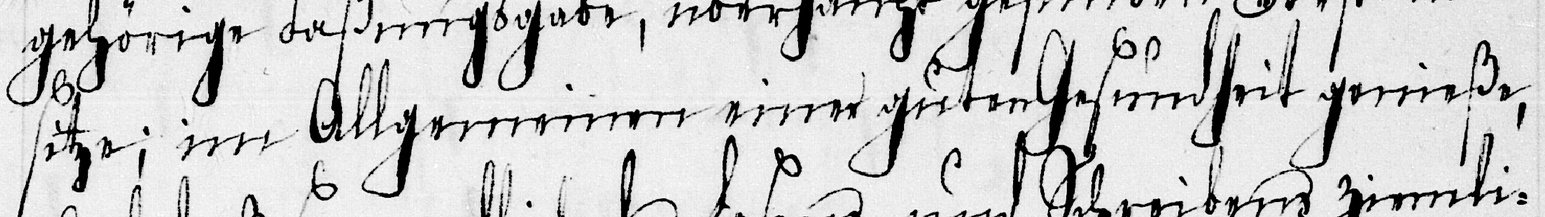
sitze; im Allgemeinen einer guten Gesundheit genieße,
